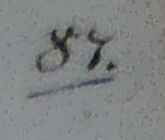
87.
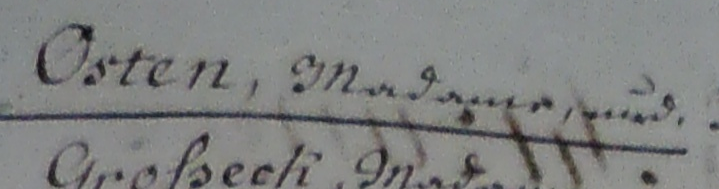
Osten, Madame, und
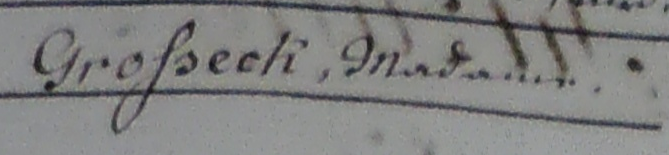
Grosseck, Madame.
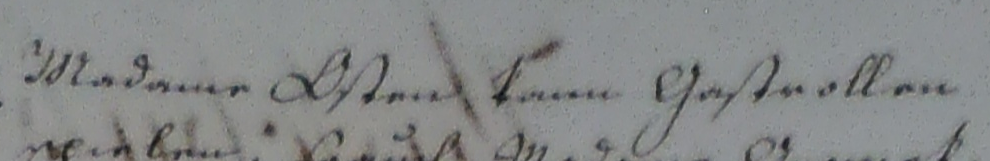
Madame Osten kann Gastrollen
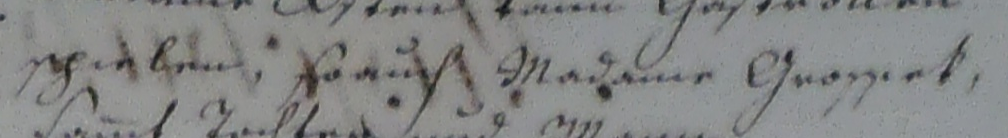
spielen, so auch Madame Grosseck,
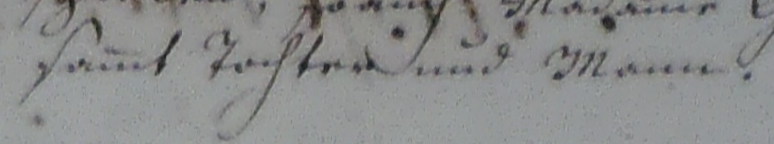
sam̅t Tochter und Mann.
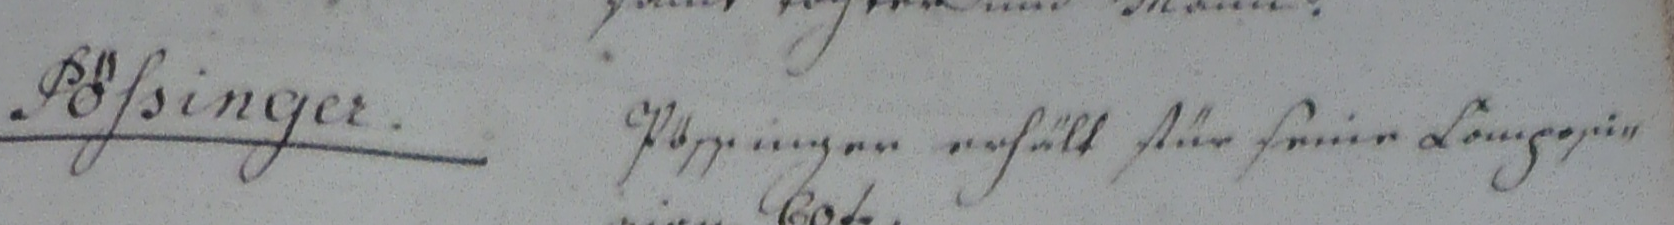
Pössinger. Pössinger erhält für seine Composi¬
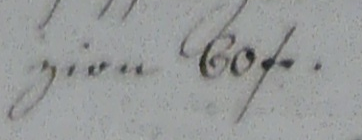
zion 60fr.
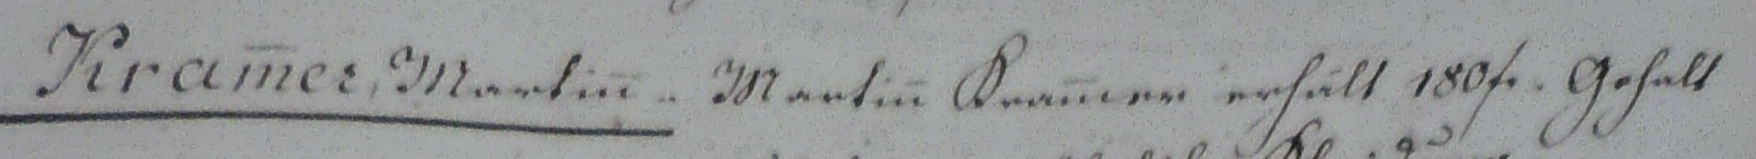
Kram̅er, Martin̅ Martin̅ Kram̅er erhält 180fr. Gehalt
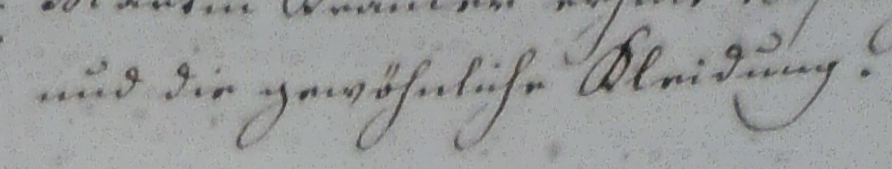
und die gewöhnliche Kleidung.
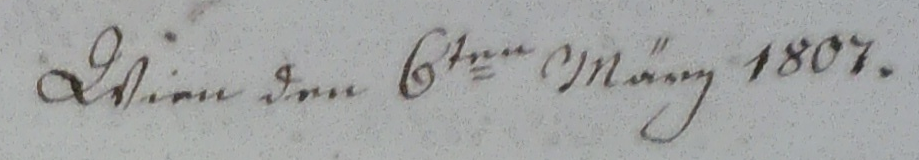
Wien den 5te͇n März 1807.
